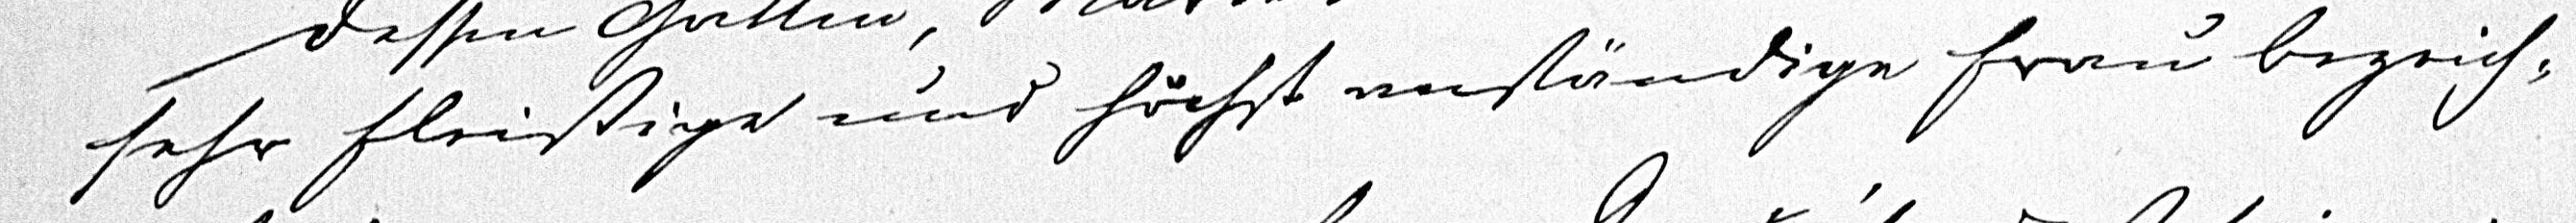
sehr Fleißige und höchst anständige Frau bezeich¬
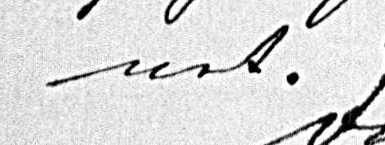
net.
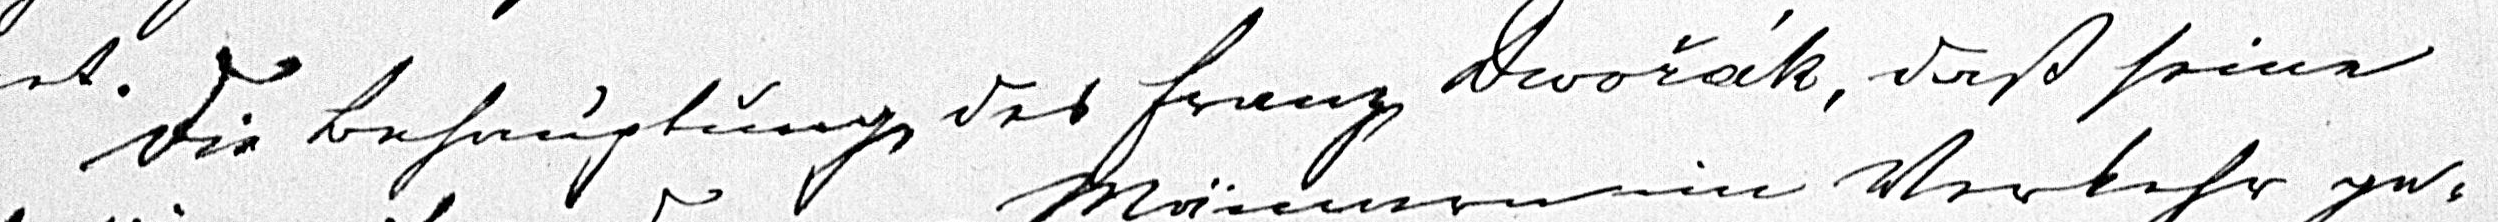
Die Behauptung des Franz Dwořák, daß seine
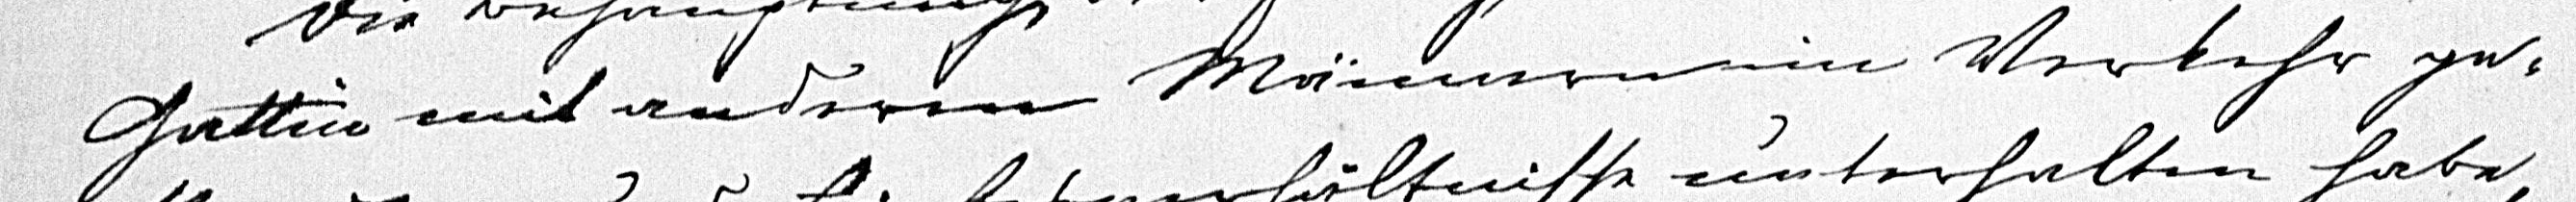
Gattin mit anderen Männerxxin Verkehr ge¬
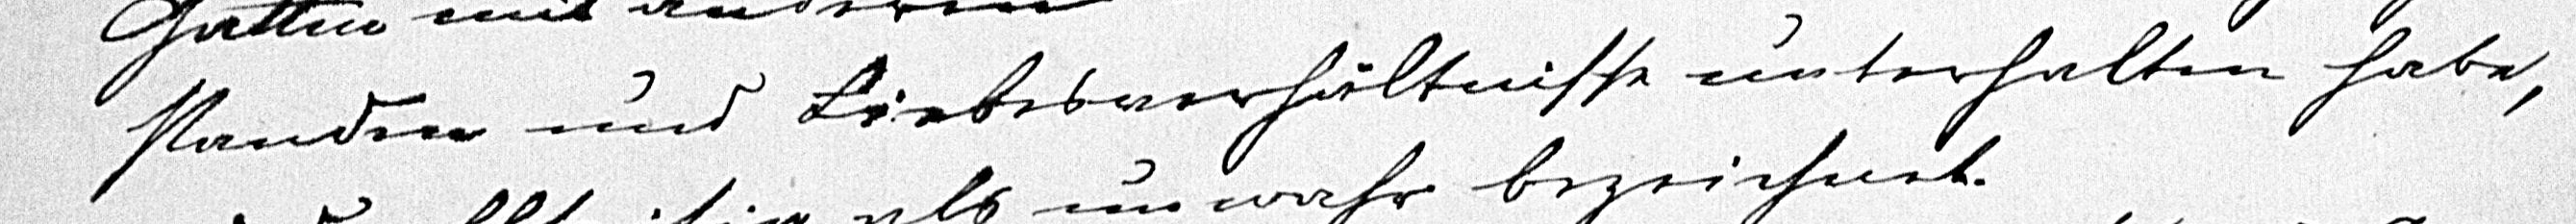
standen und Liebesverhältnisse unterhalten habe,
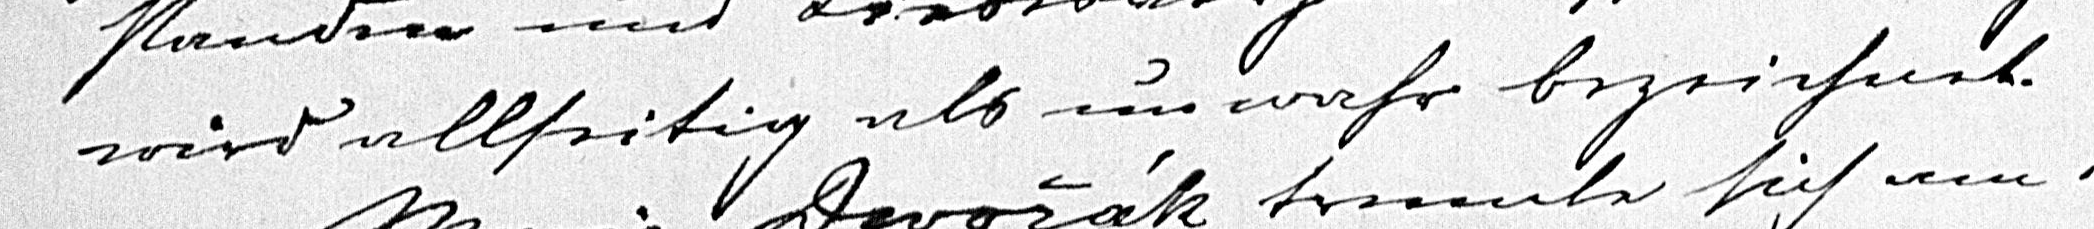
wird allseitig als xx wahr bezeichnet.
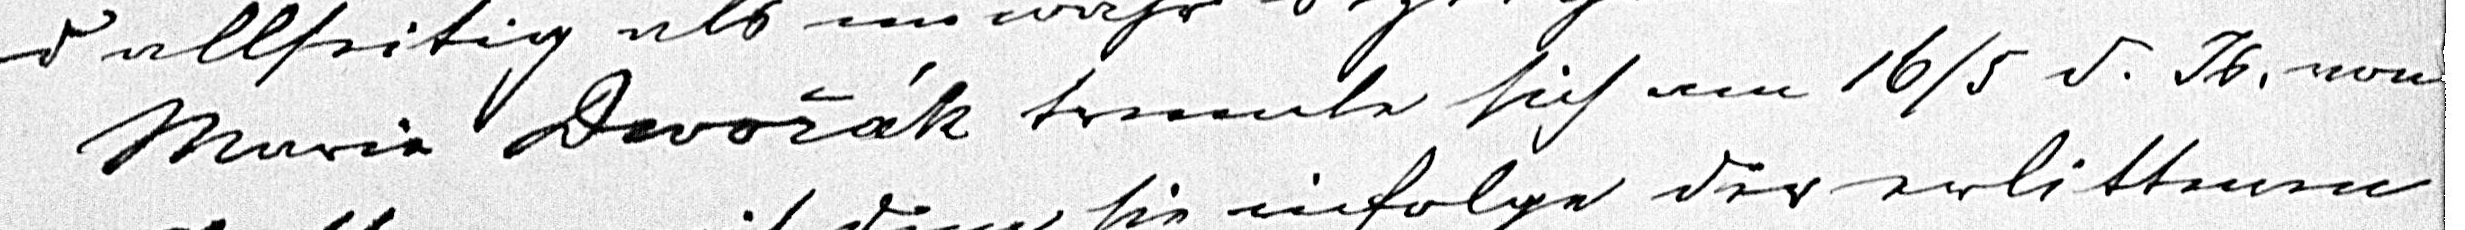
Marie Dwořák trennte sich am 16/6 d. xx, von
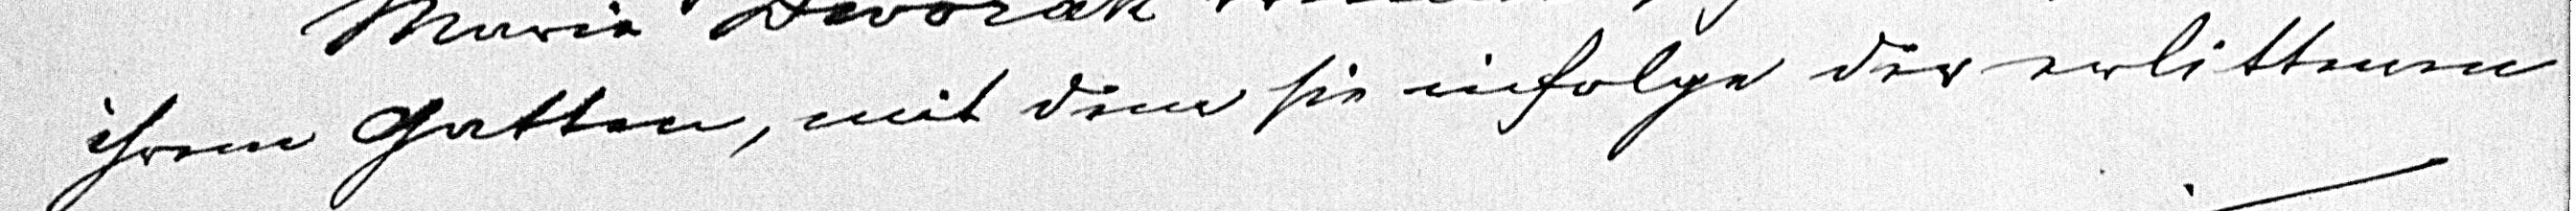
ihrem Gatten, mit dem sie infolge der erlittenen
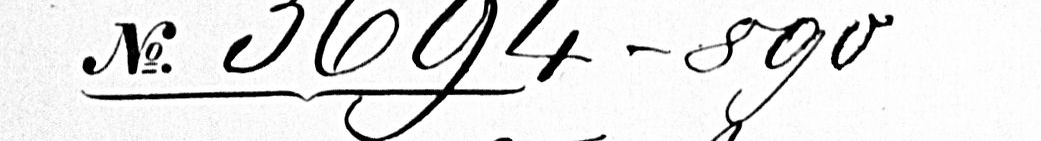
N° 3694-890
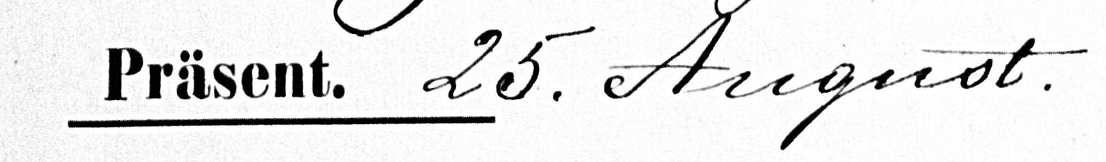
Präsent. 25. August.
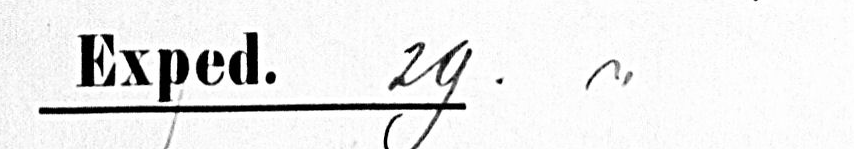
Exped. 29. August.
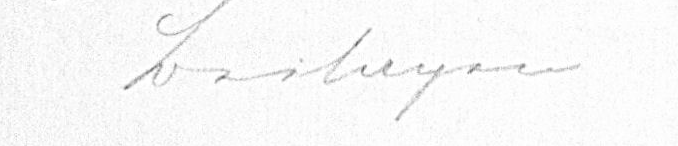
Beilagen
